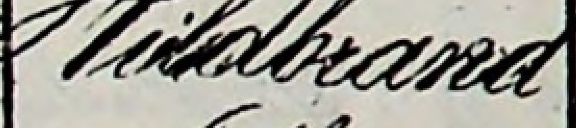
Hildbrand
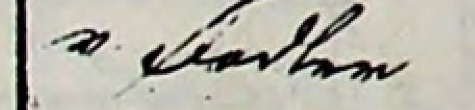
v. Fedler
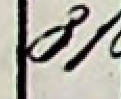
81
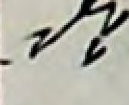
Do
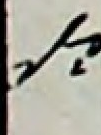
Do
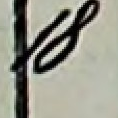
18
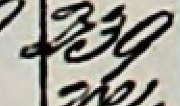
239
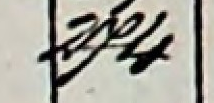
274
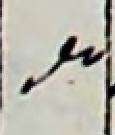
Do
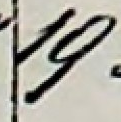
19
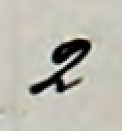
2
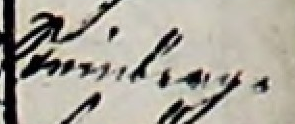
Steinberg„
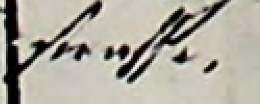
strasse
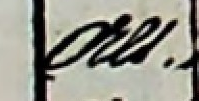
Alt„
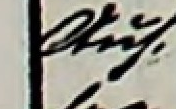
Aus„
